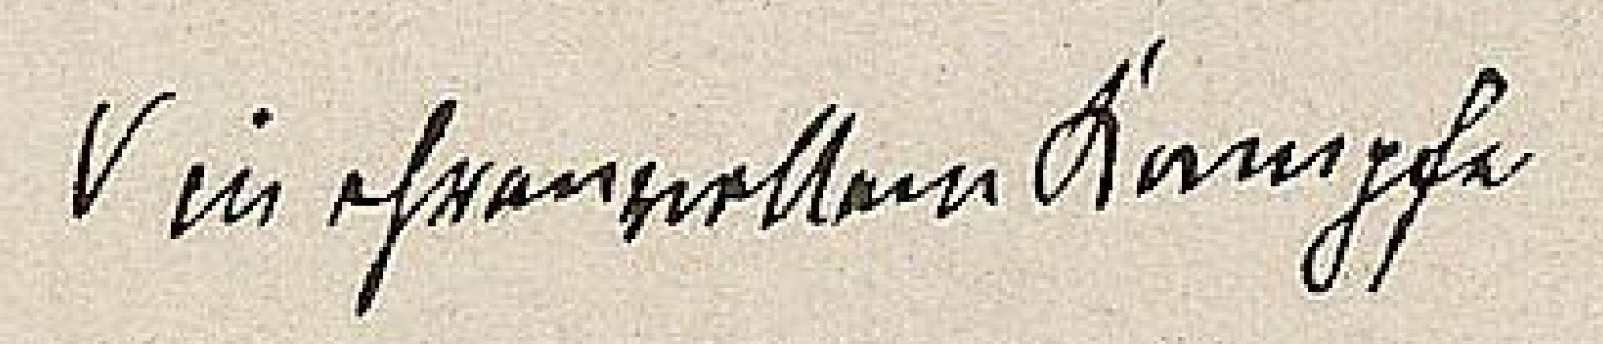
V in ehrenvollem Kampfe
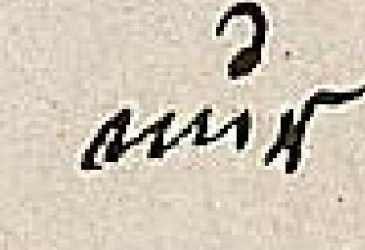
nur
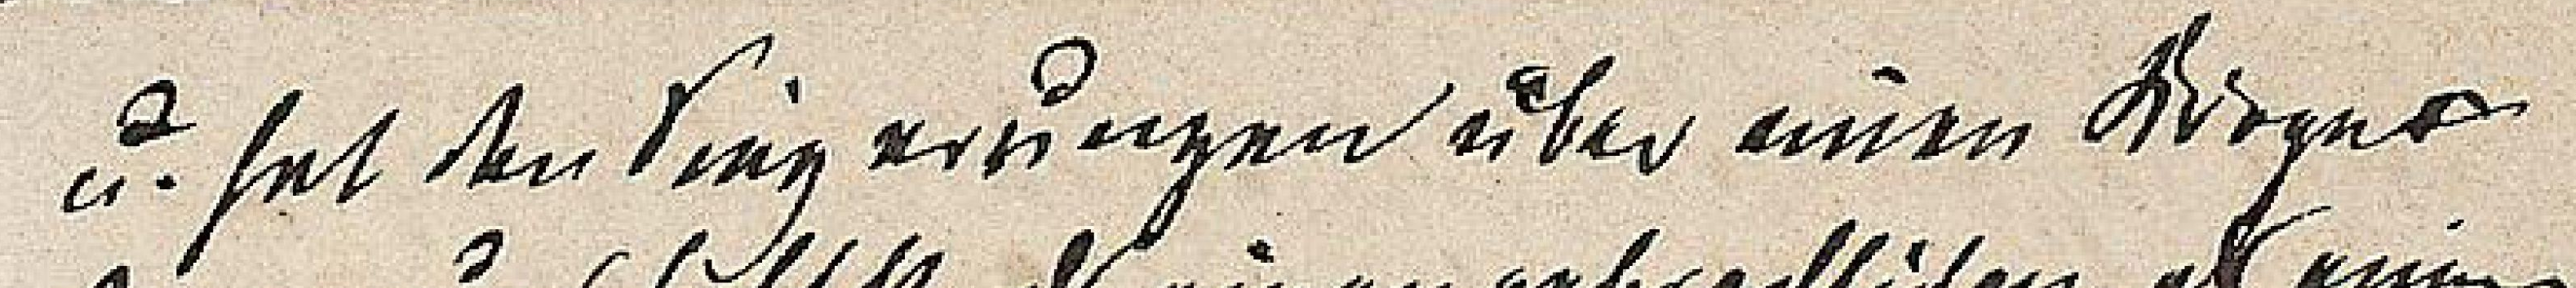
u. hat den Sieg errungen über einen Krieger
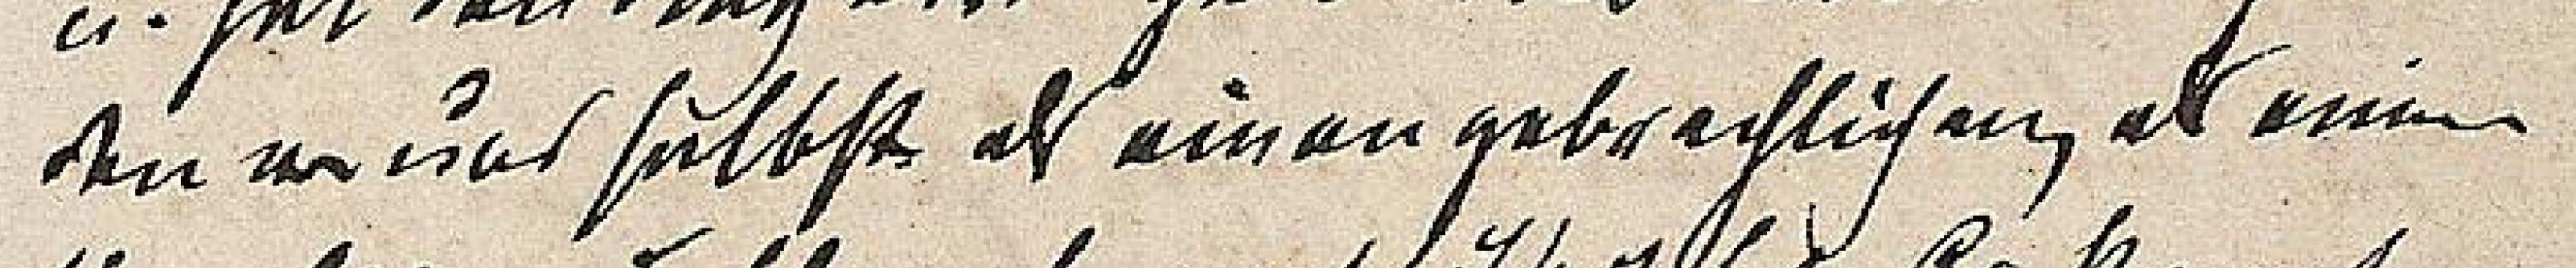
den er uns selbst als einen gebrechlichen, als einen
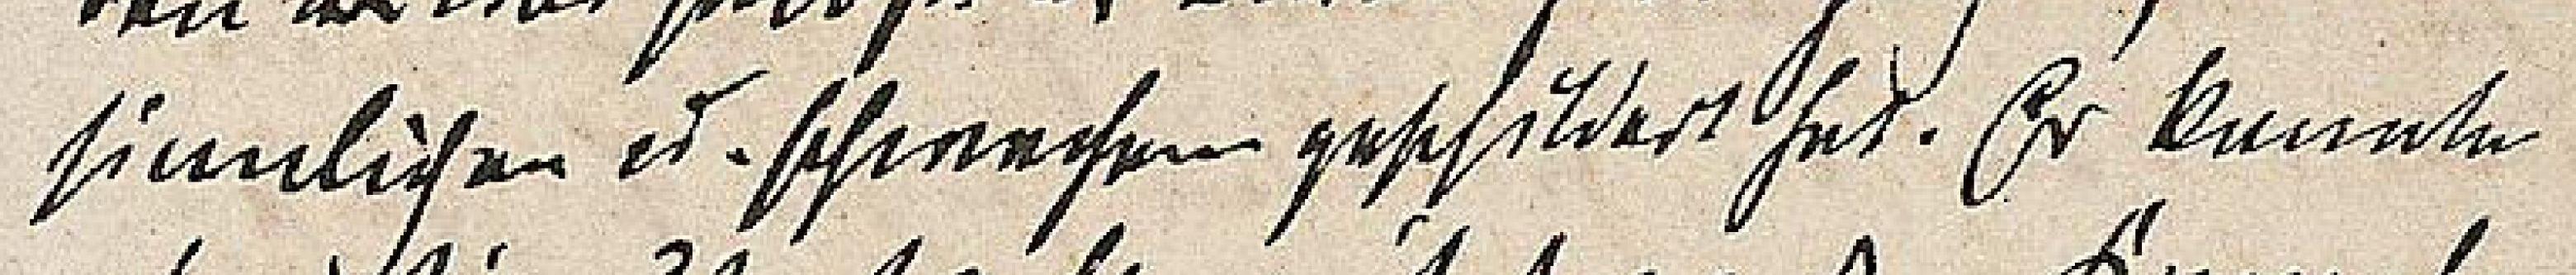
sinnlichen u schwachen geschildert hat. Er kannte
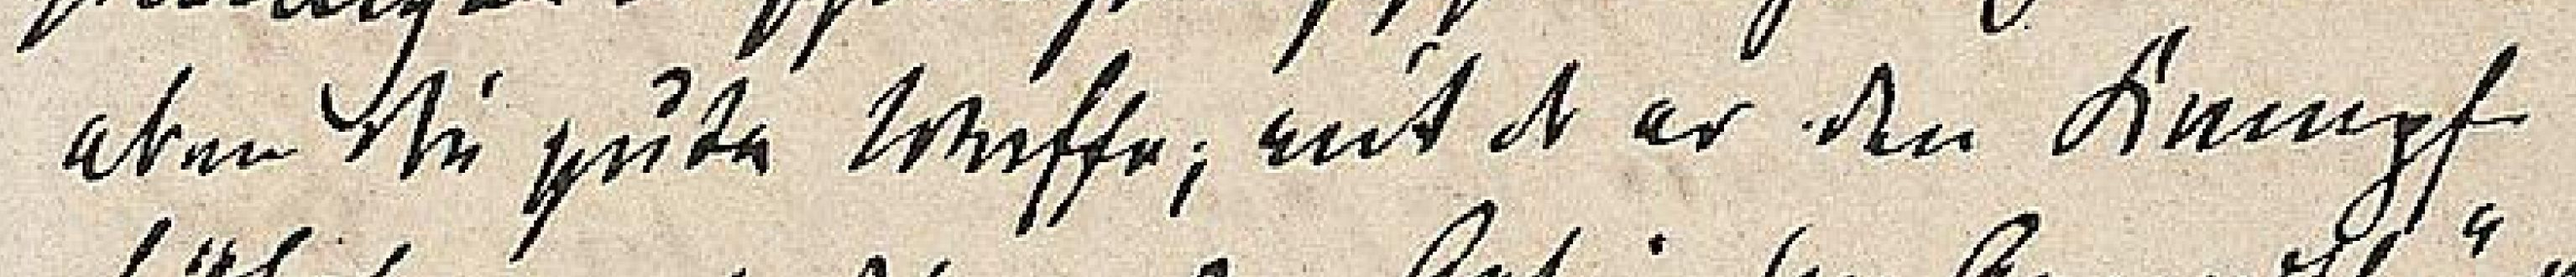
eben die gute Waffe, mit dr er den Kampf
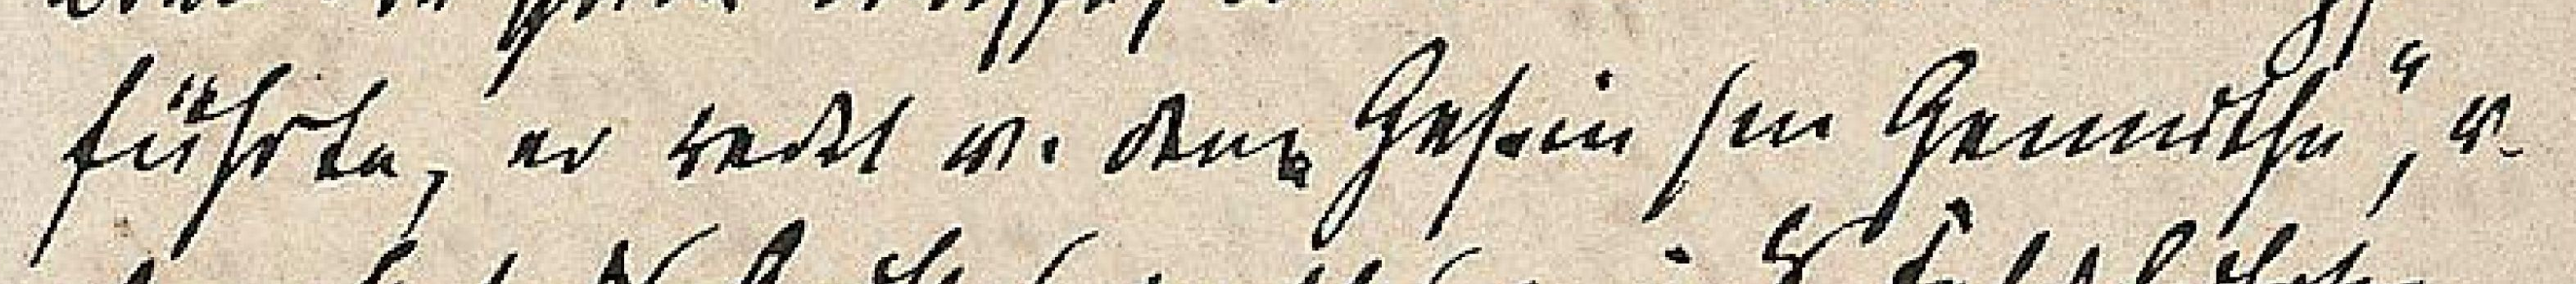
führt, er redet v. dem Gesein sm Gemüthe," v.
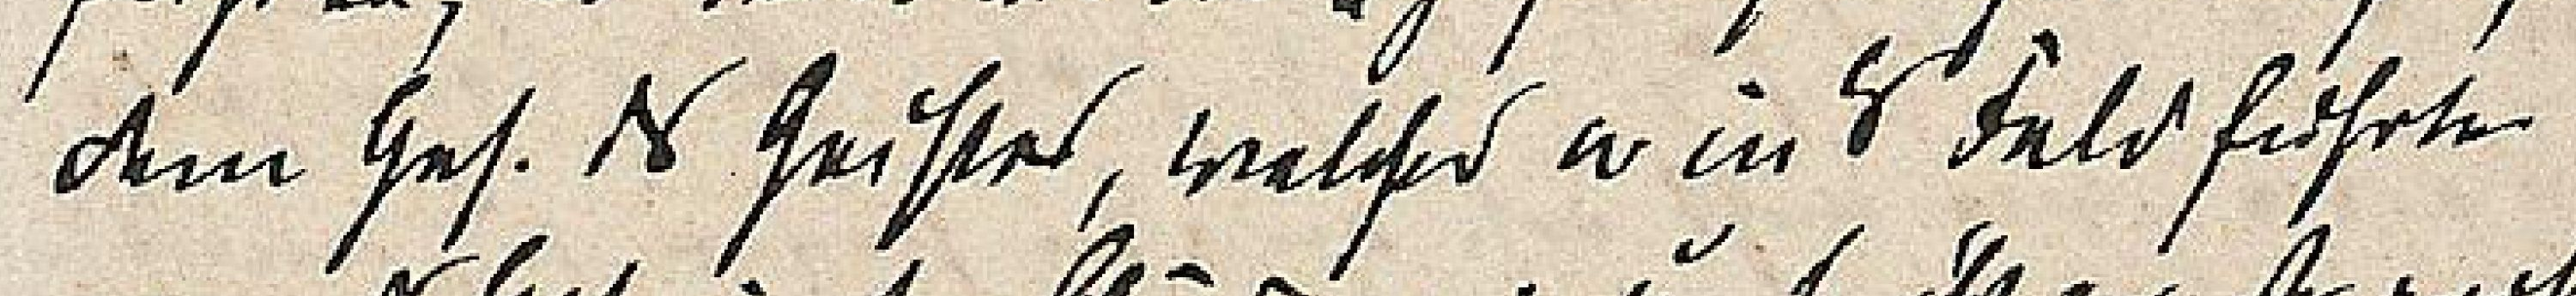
dem Ges. des Geistes, welches er in's Feld führte
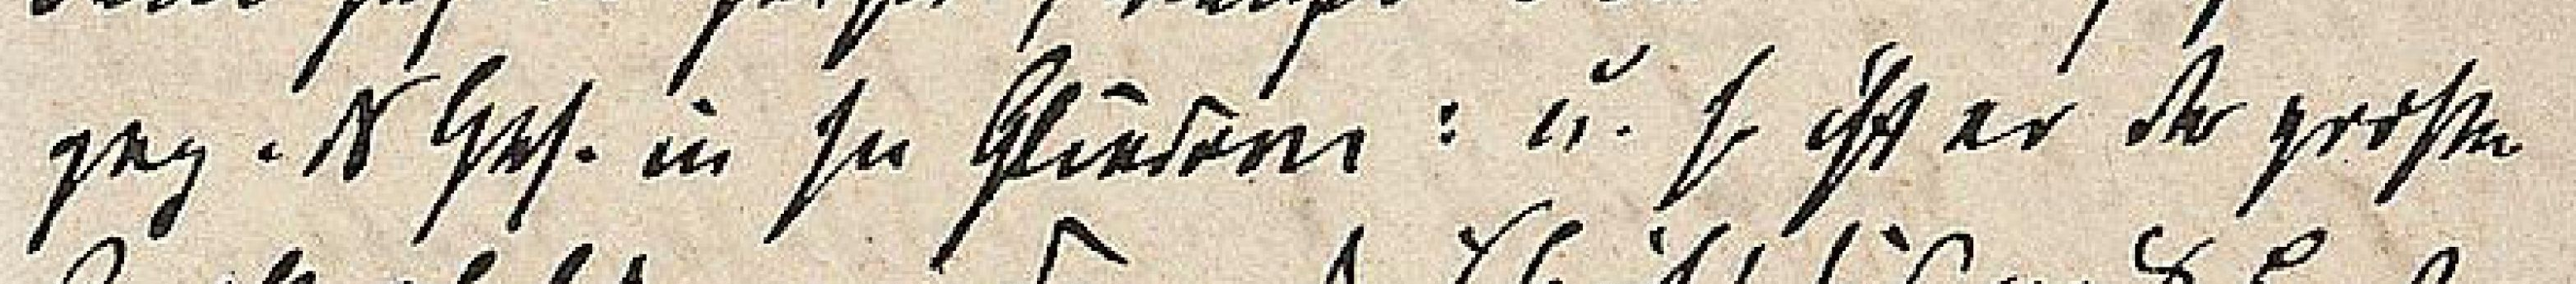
geg. das Ges. in seinen Gliedern: u. so ist er der größte
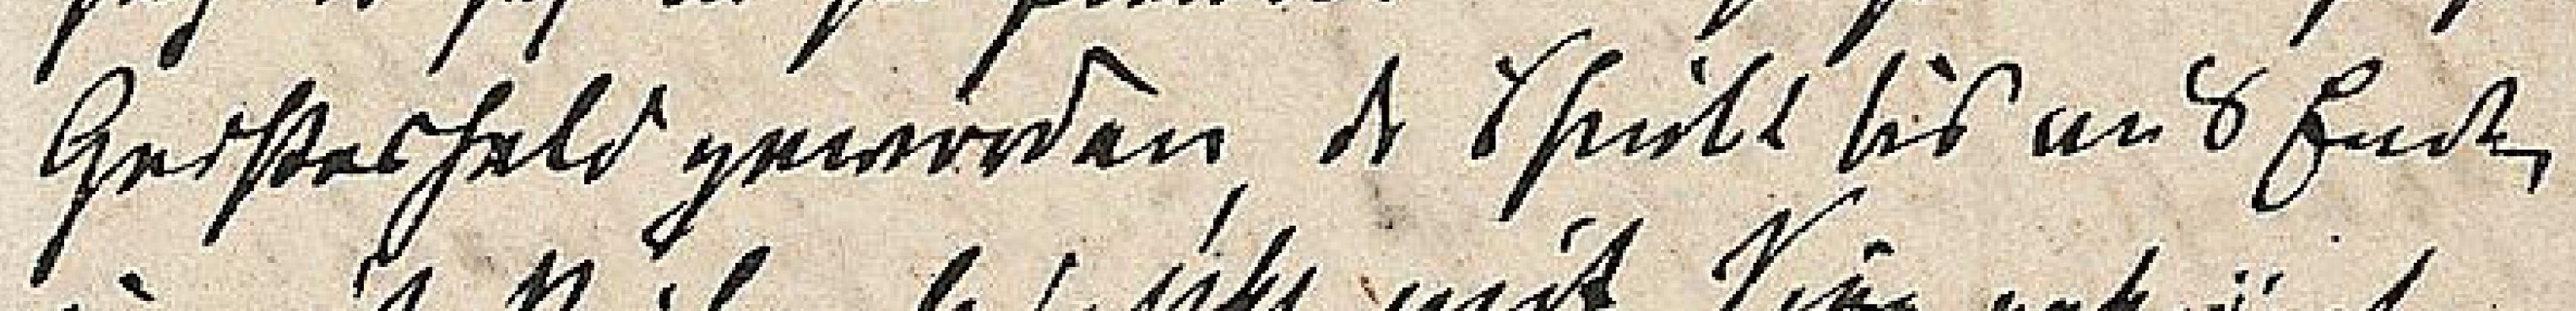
Geistesheld geworden, der shält bis an's Ende,
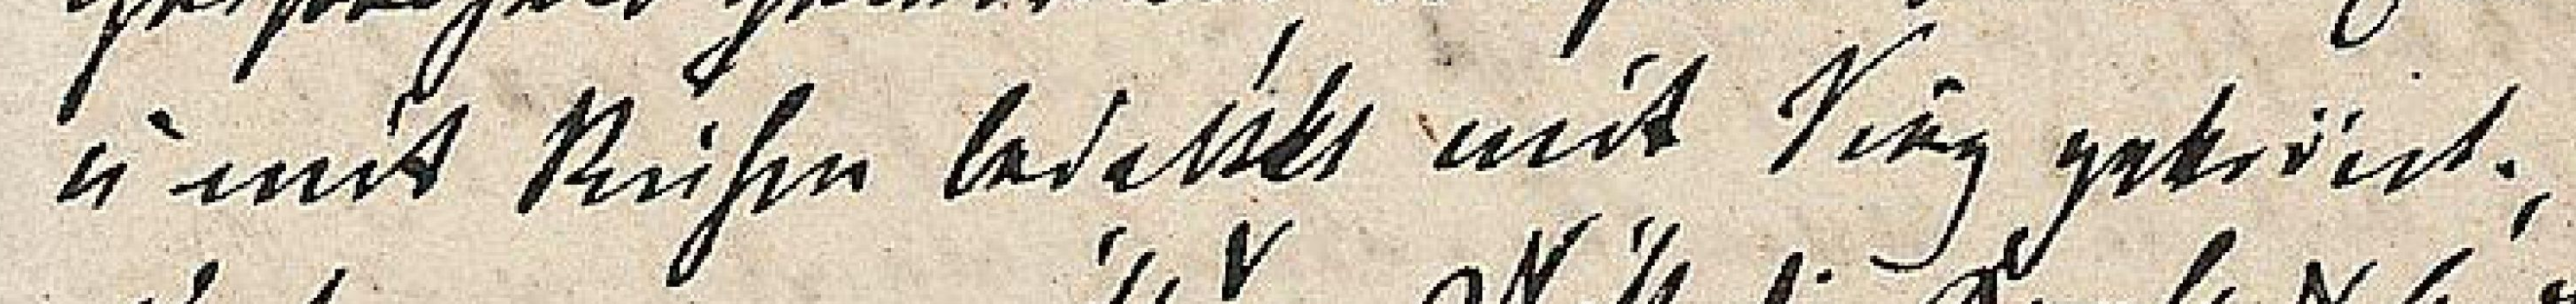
u mit Ruhm bedenk mit Sieg gekrönt.
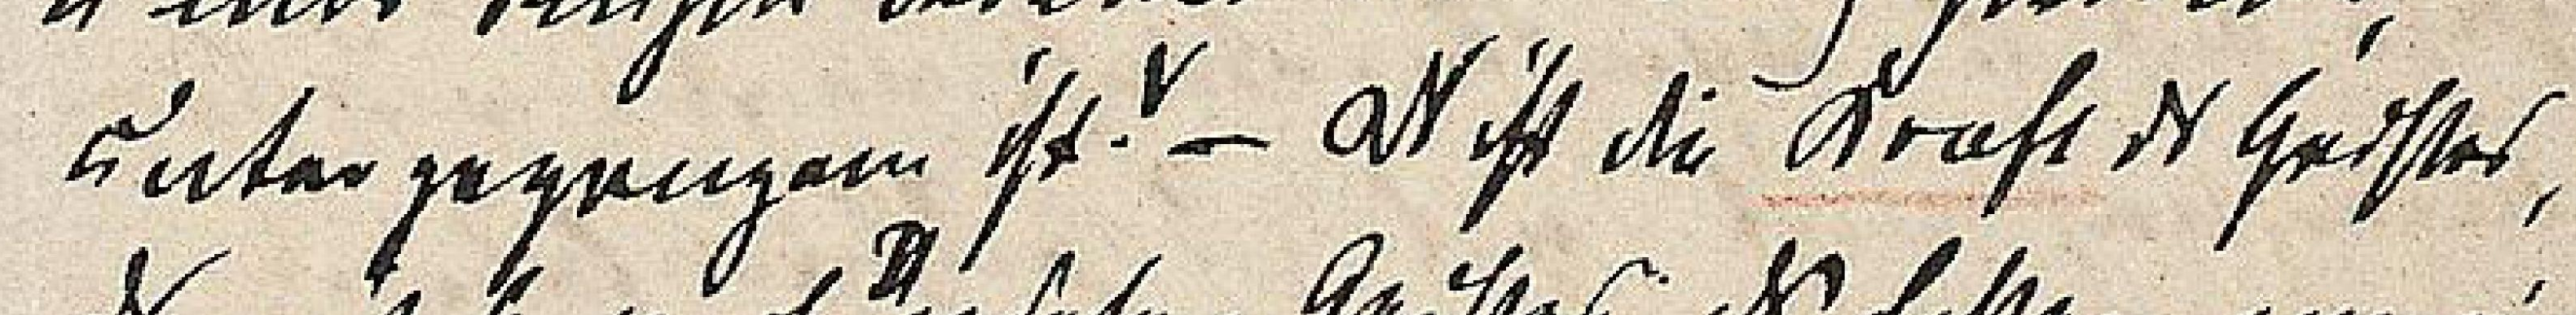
untergegaengen ist . V _ Ds ist die Kraft dr Geistes,
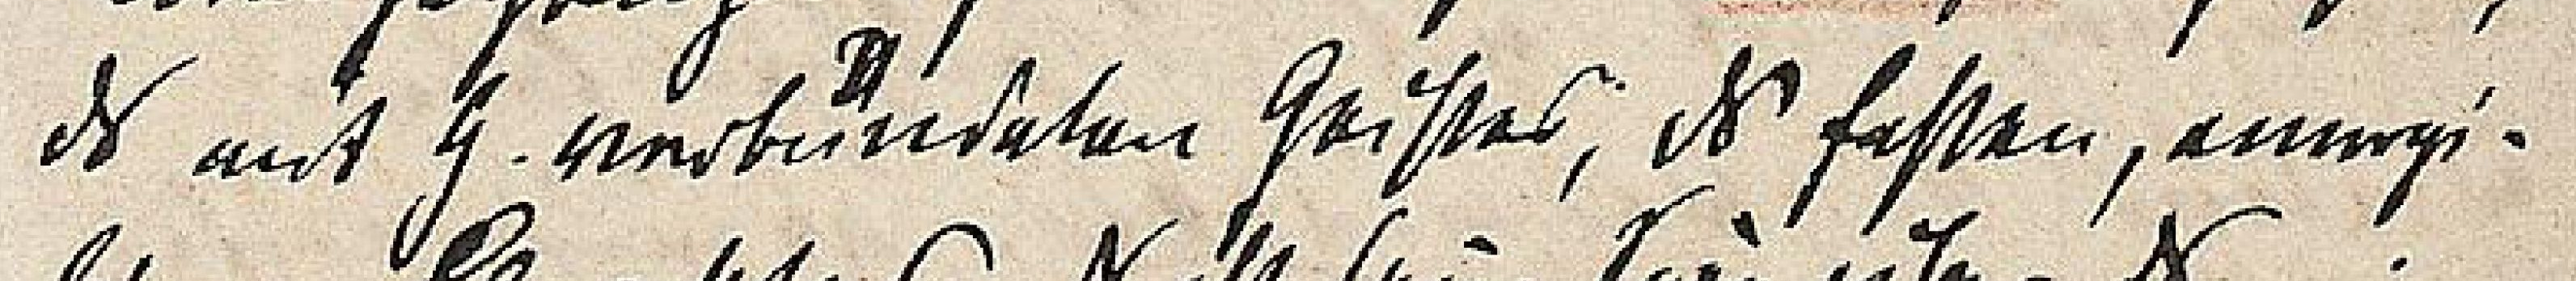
ds mit G. verbündeten Geistes, ds festen, energi¬
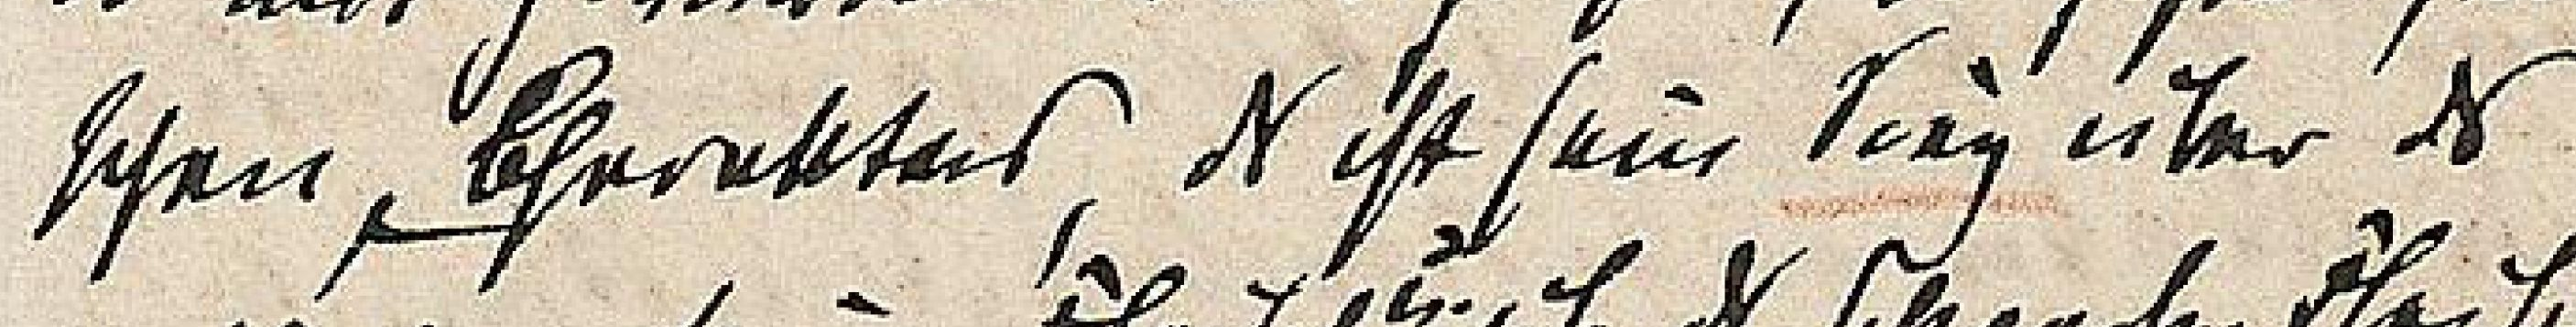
schen, Charakters, ds ist sein Sieg über ds
